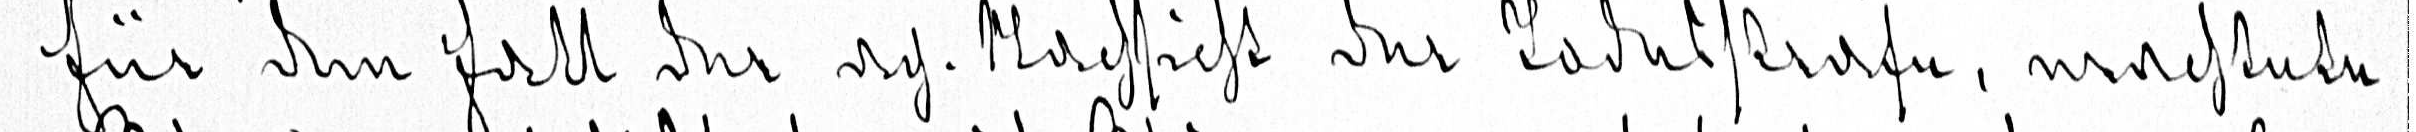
Für den Fall der ag. Nachsicht der Todesstrafe, erachtete
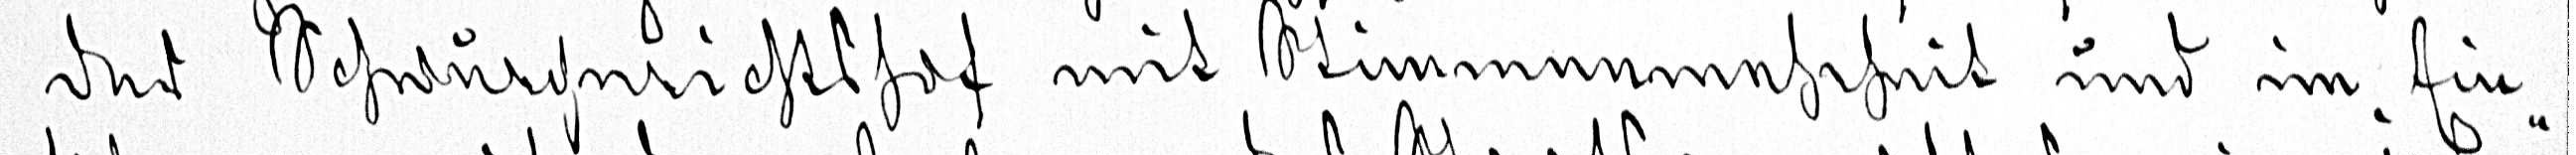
der Schwurgerichtshof mit Simmenmehrheit und im Ein¬
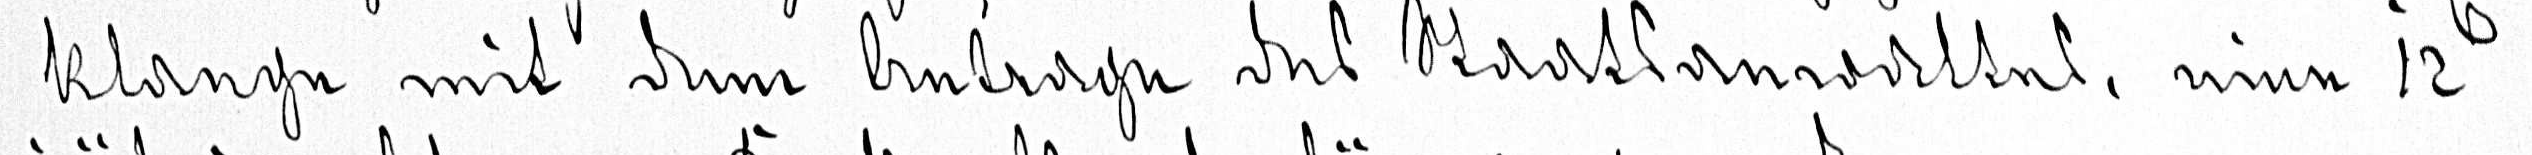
klange mit dem Antrage des Staatsanwaltes, eine 12
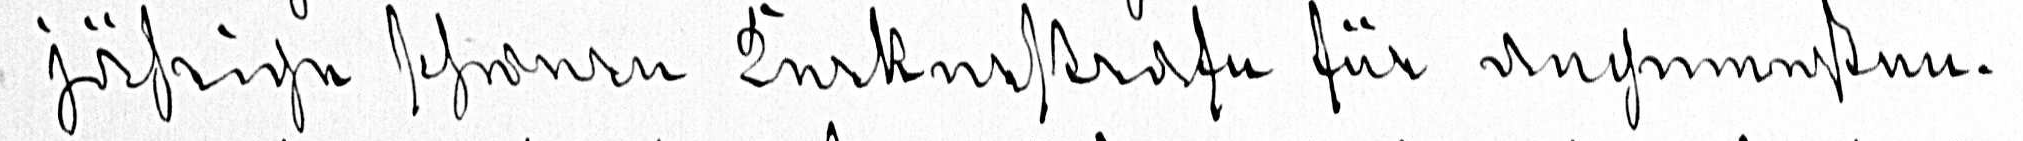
jährige schwere Kerkerstrafe für angemeßen.
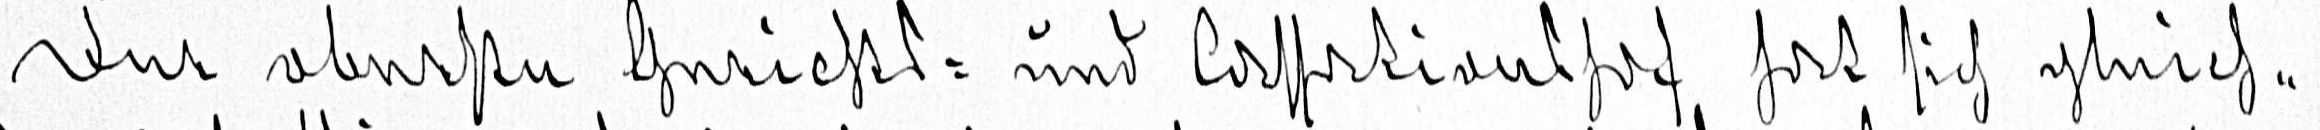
Der oberste Gerichts- und Cassatinshof hat sich gleich¬
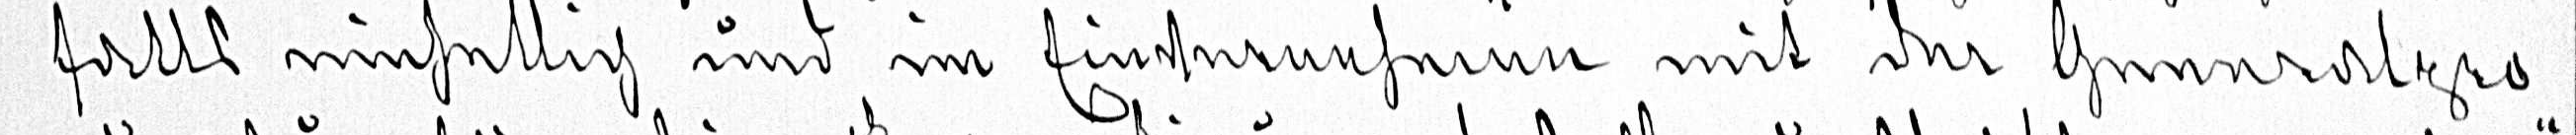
falls einhellig und im Einverehmen mit der Generalpro¬
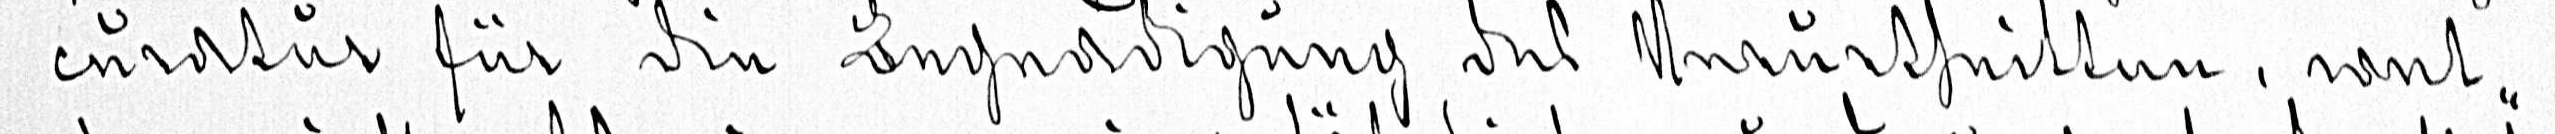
kuratur für die Begnadigung des Verurtheilten, wel¬
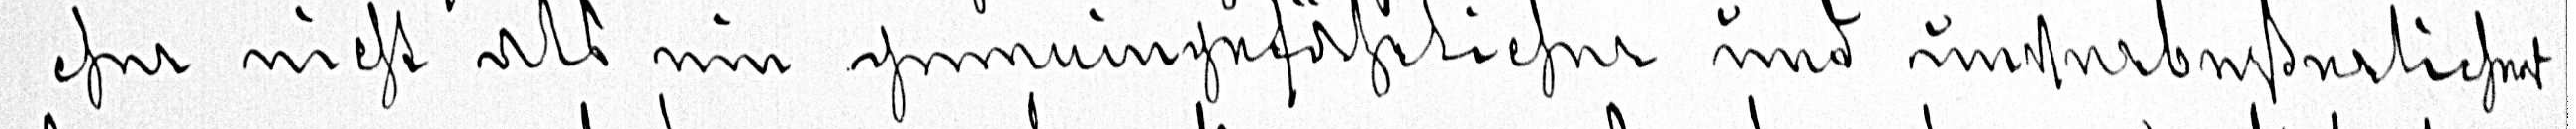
cher nicht als ein gemeingefährlicher und unverbeßerlicher
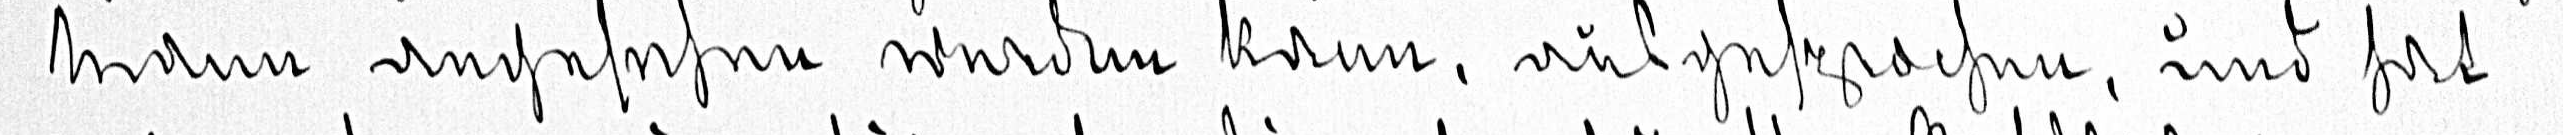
Mann angesehen werden kann, ausgesprochen, und hat
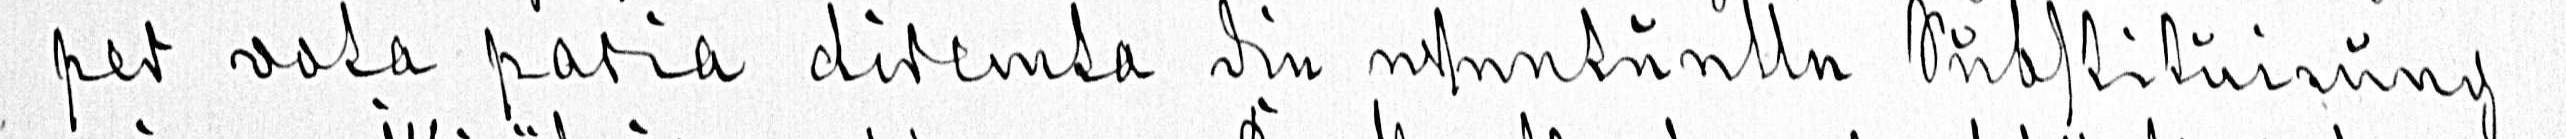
per vota paria diremta die eventuelle Substituirung
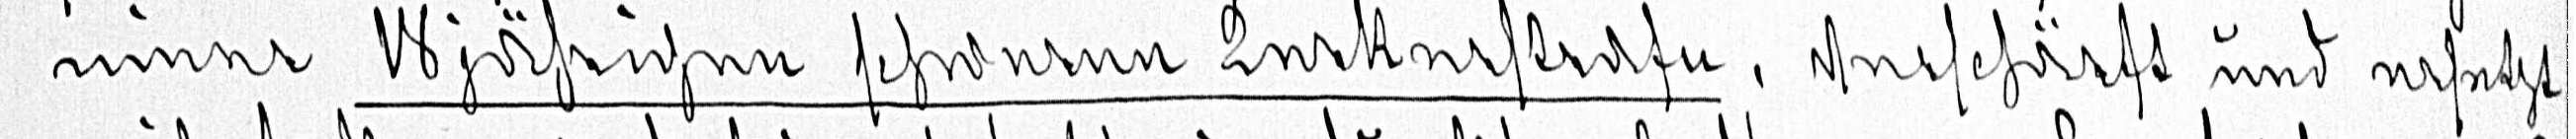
einer 18jährigen schweren Kerkerstrafe, verschärft und ursetzt
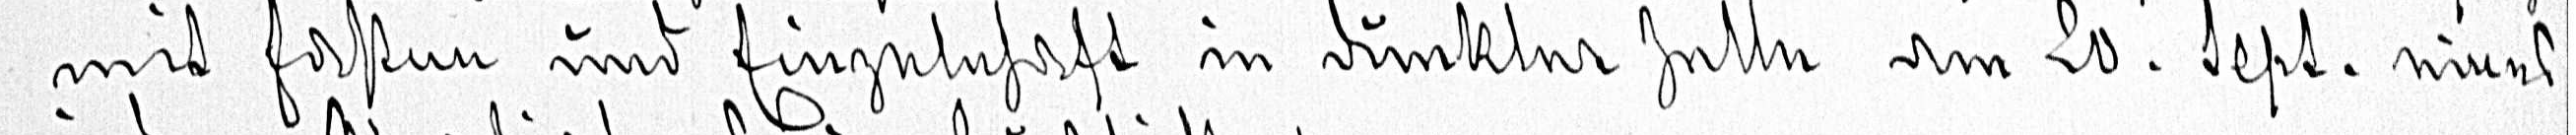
mit Fasten und Einzelhaft in dunkler Zelle am 20. Sept. eines
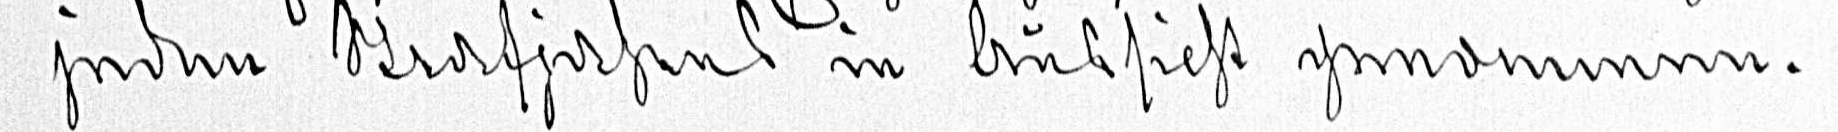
jeden Strafjahres in Aussicht genommen.
